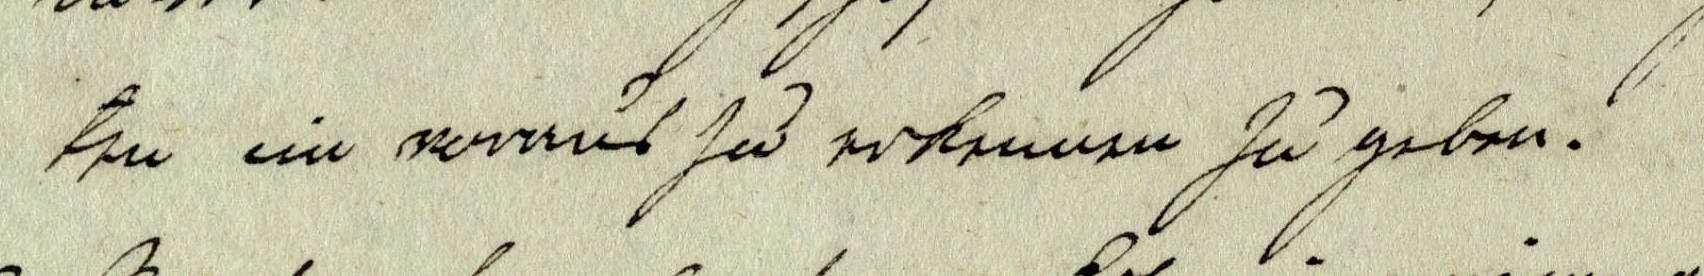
ten m voraus zu erkennen zu geben.
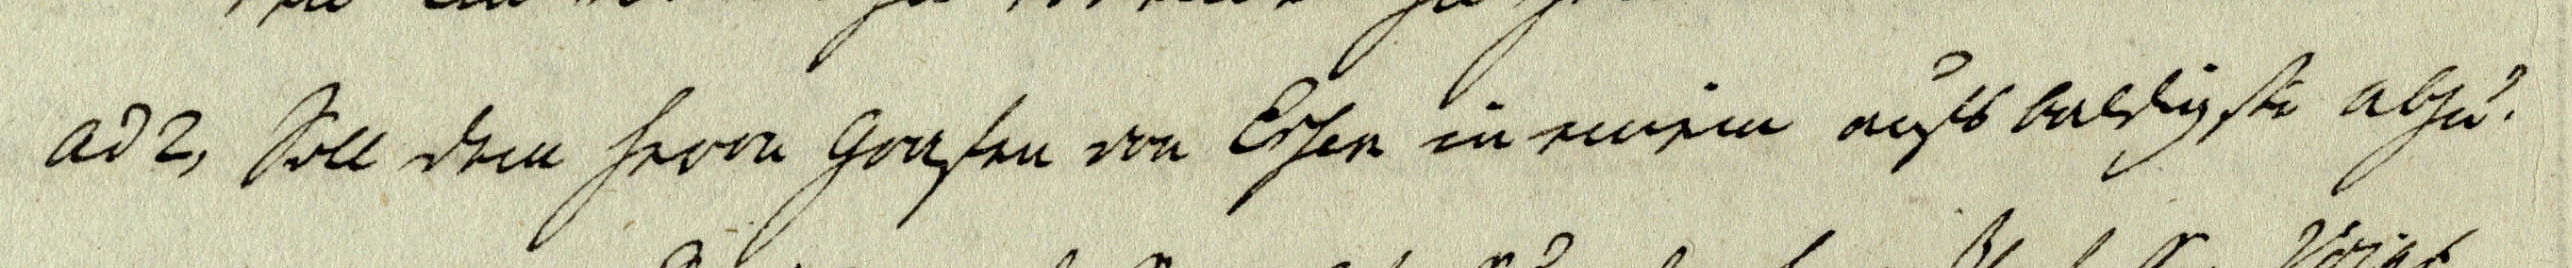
ad 2, Soll dem Herrn Grafen von Essen in einem aufs baldigste abzu¬
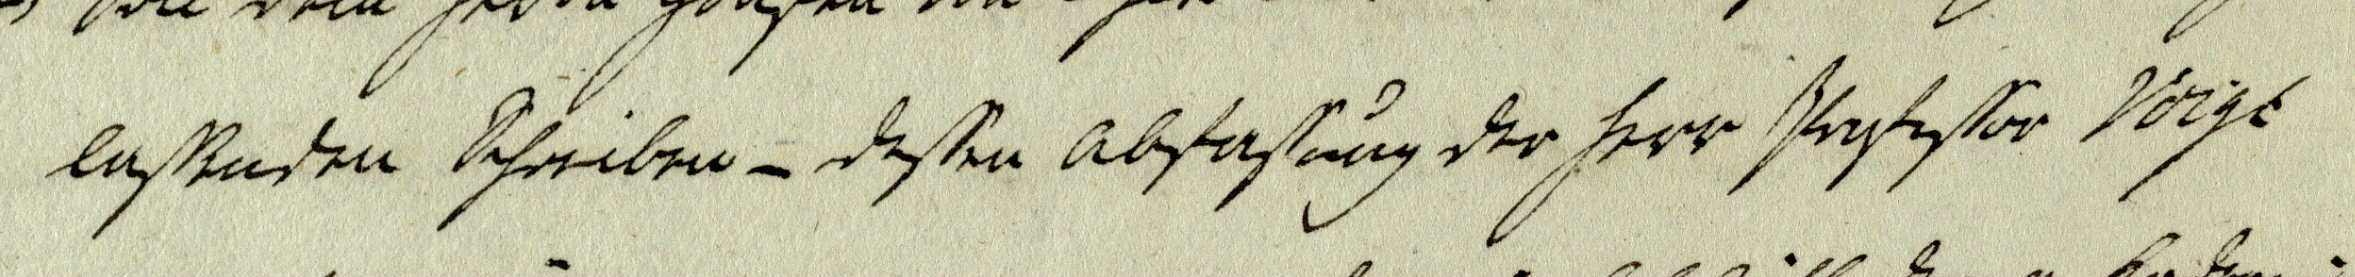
lassenden Schreiben - dessen Abfassung der Herr Professor Voigt
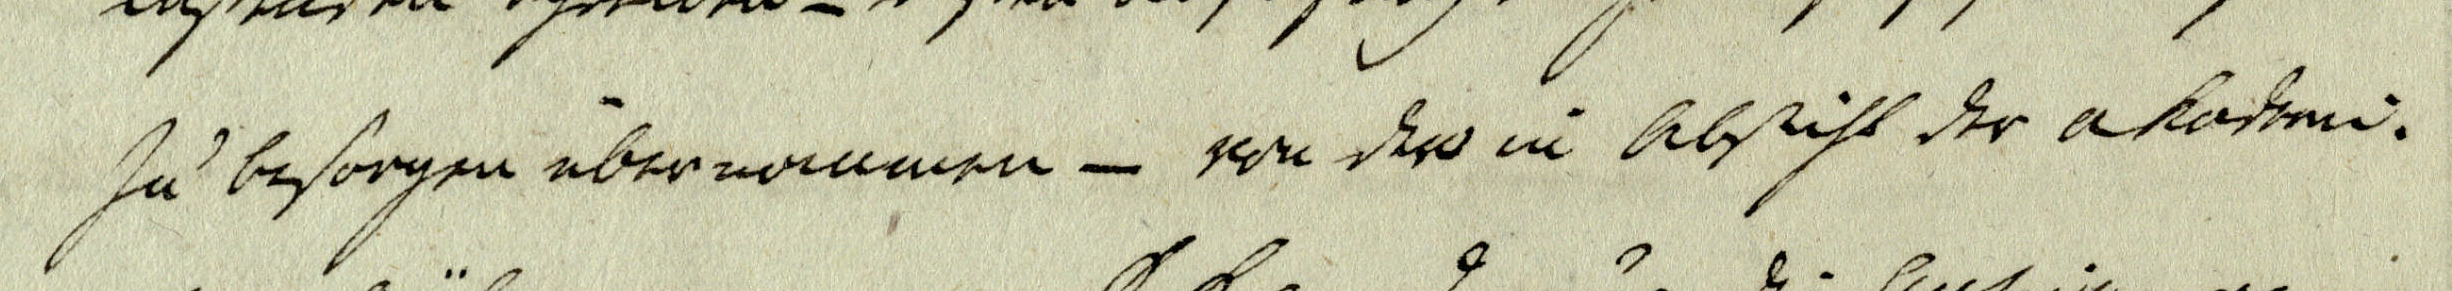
zu besorgen übernommen - von der in Absicht der akademi¬
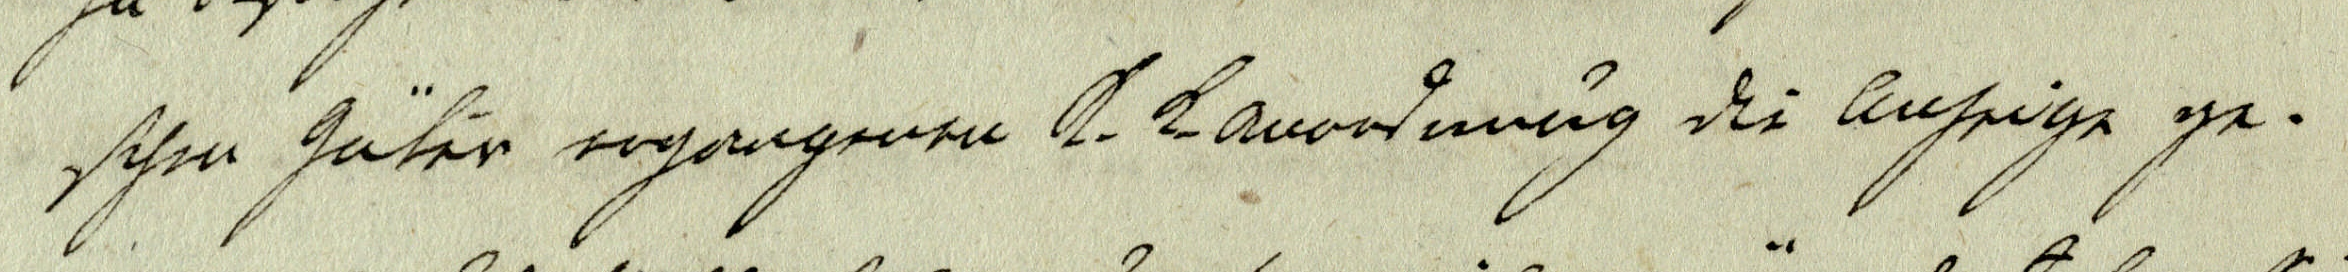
schen Güter ergangenen K. K. Anordnung die Anzeige ge¬
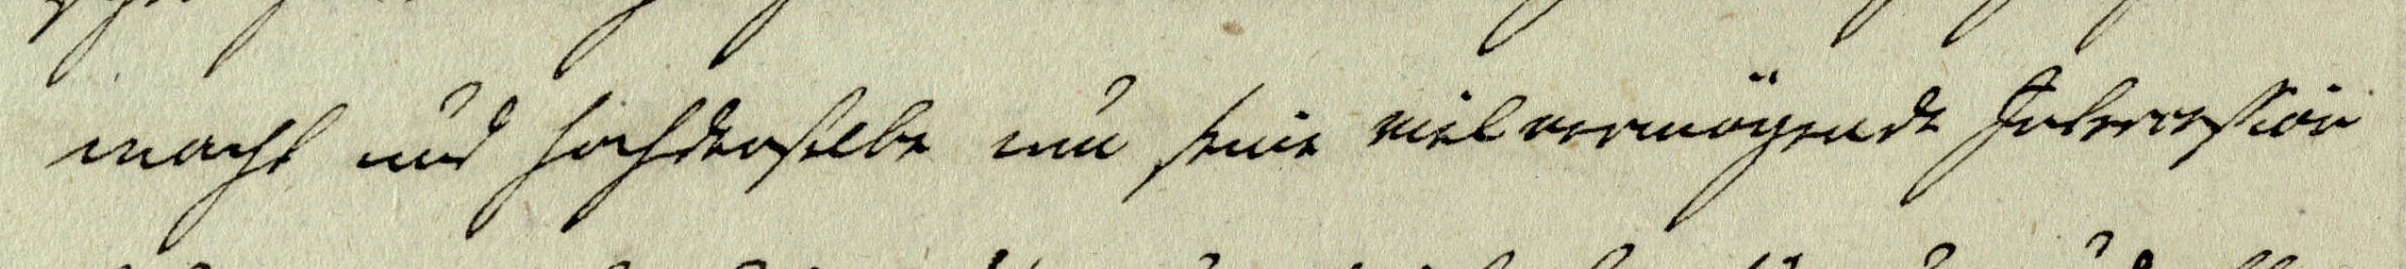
macht und Hochderselbe um seine vielvermögende Intercession
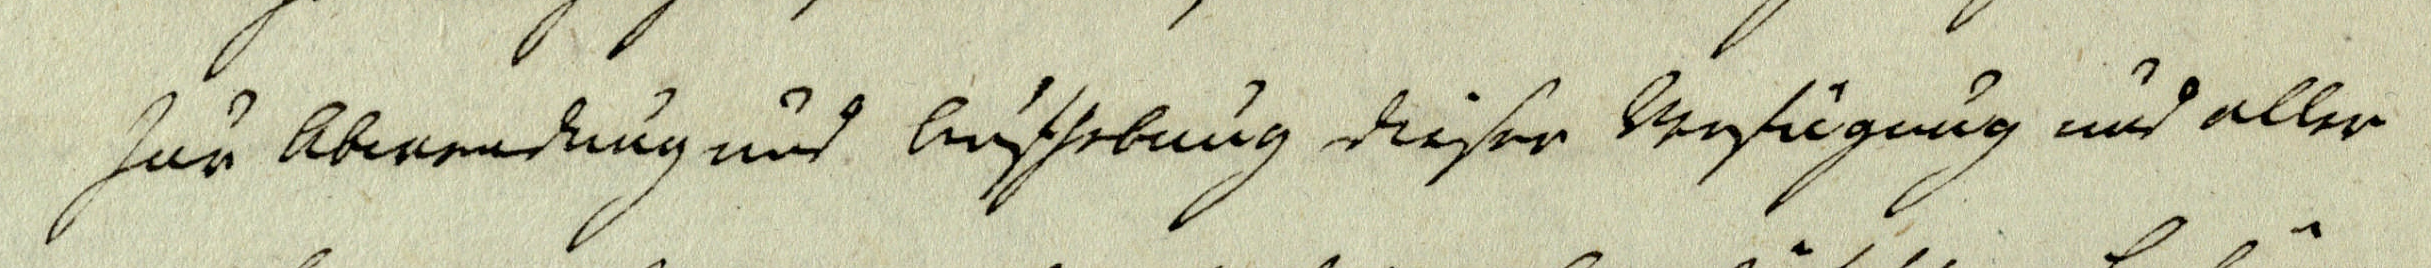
zur Abwendung und Aufhebung dieser Verfügung und aller
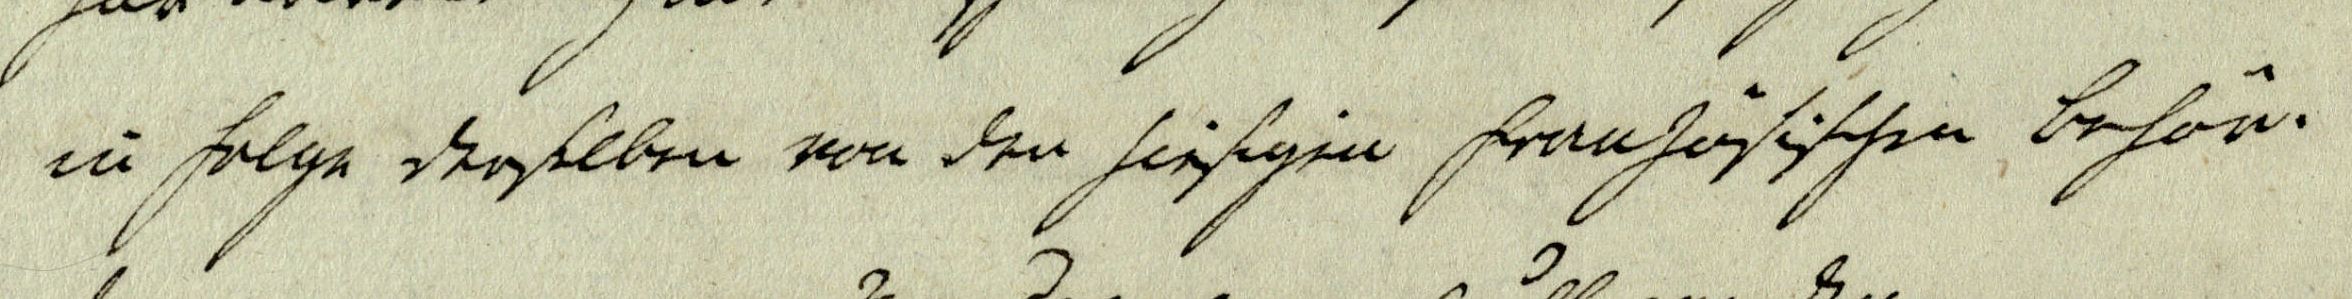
in Folge derselben von den hiesigen Französischen Behör¬
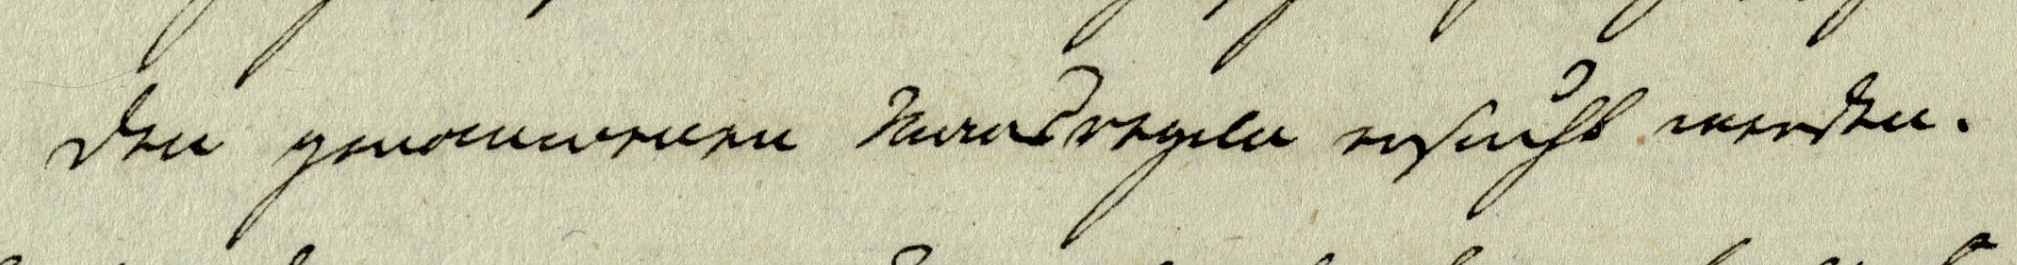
den genommenen Maasregeln ersucht werden.
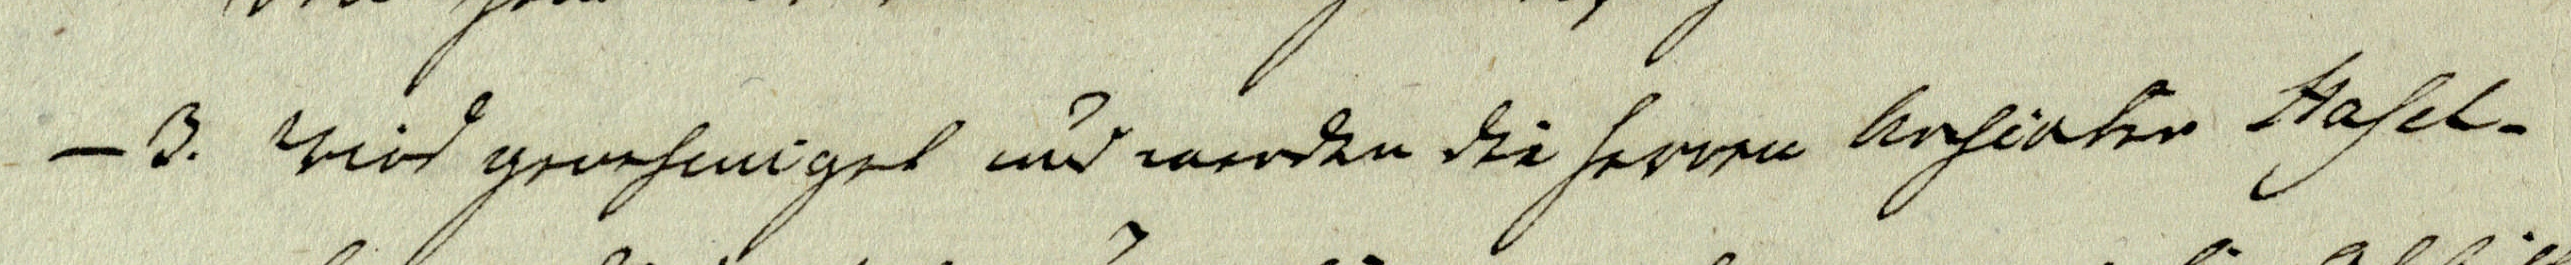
3. Wird genehmiget und werden die Herren Archiater Hasel¬
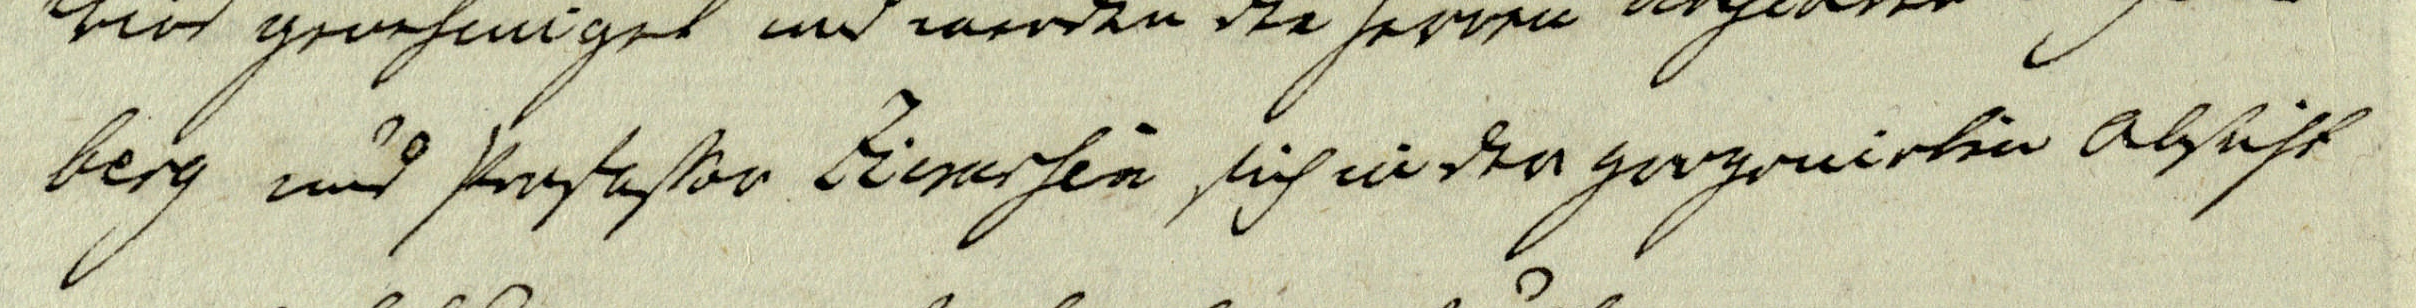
berg und Professor Ziemssen sich in der proponirten Absicht
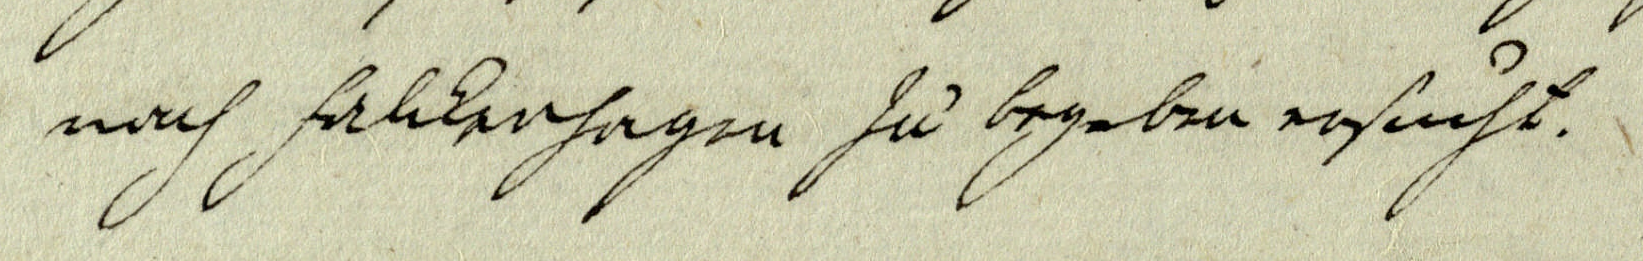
nach Falckenhagen zu begeben ersucht.
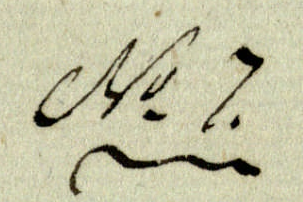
No 7.
